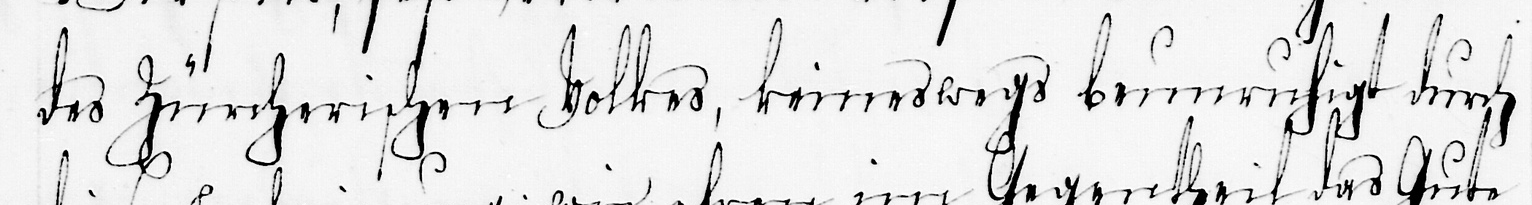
des Zürcherischen Volkes, keineswegs beunruhigt durch
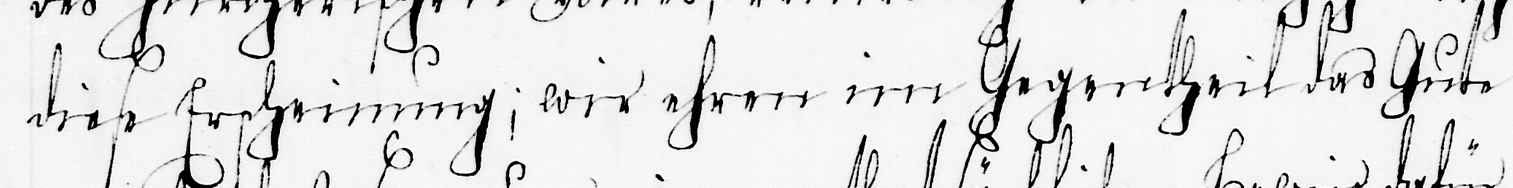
diese Erscheinung; wir ehren im Gegentheil das Gute
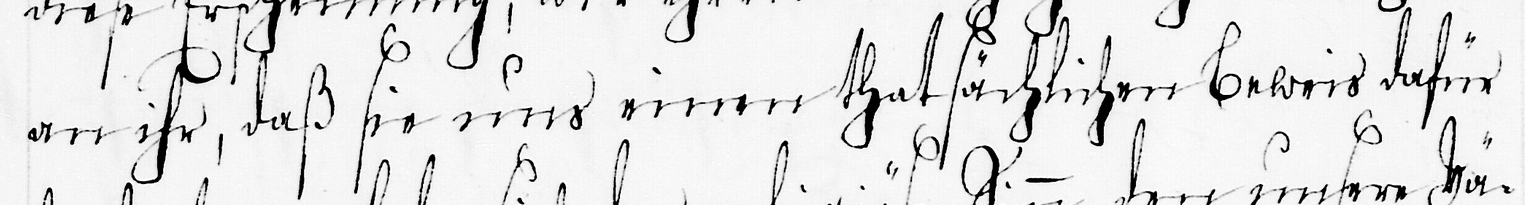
an ihr, daß sie uns einen thatsächlichen Beweis dafür
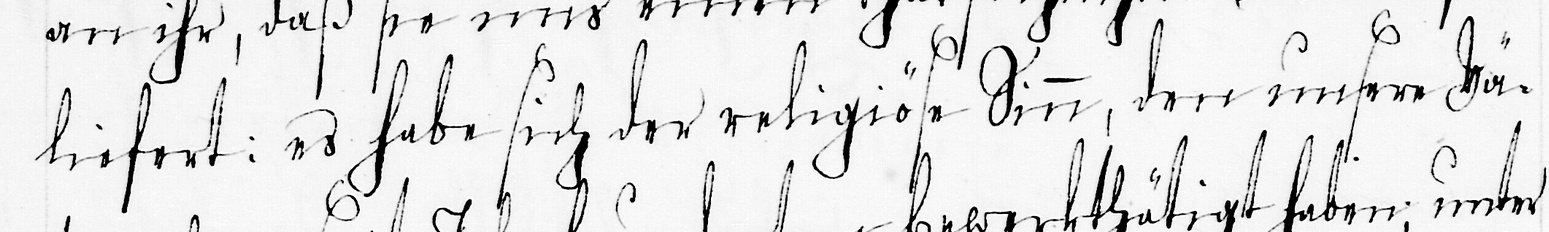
liefert: es habe sich der religiöse Sinn, den unsere Vä¬
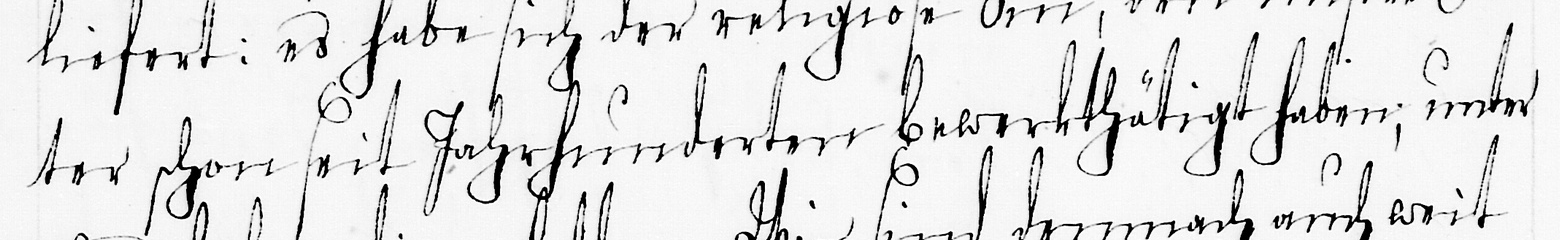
ter schon seit Jahrhunderten bewerkthätigt haben; unter
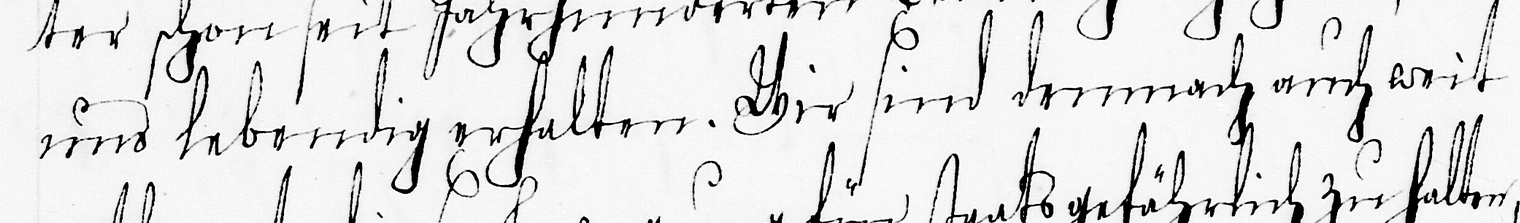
uns lebendig erhalten. Wir sind demnach auch weit
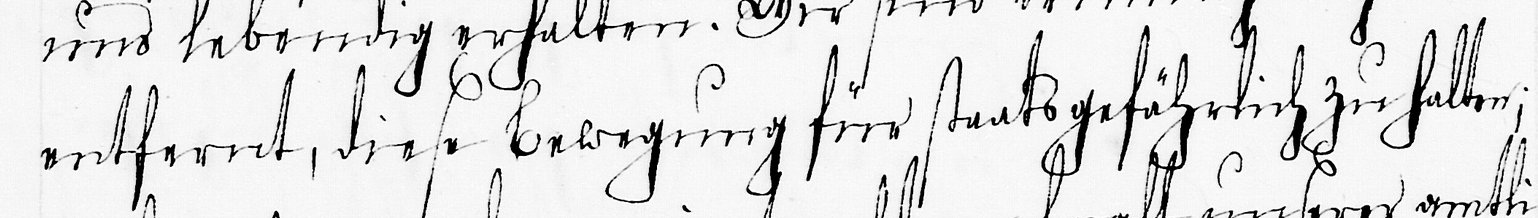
entfernt, diese Bewegung für staatsgefährlich zu halte¬
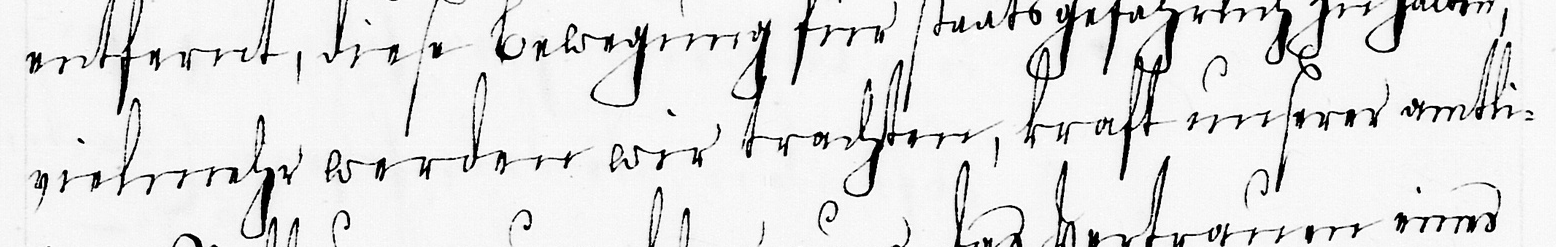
vielmehr werden wir trachten, kraft unserer amtli¬
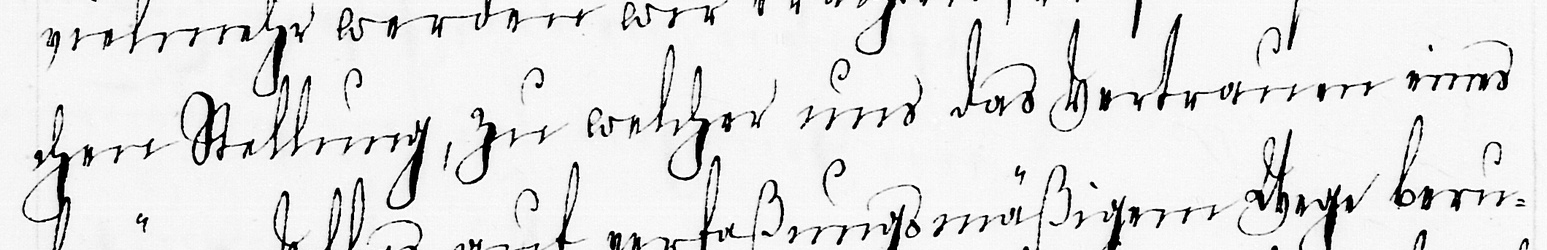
chen Stellung, zu welcher uns das Vertrauen eines
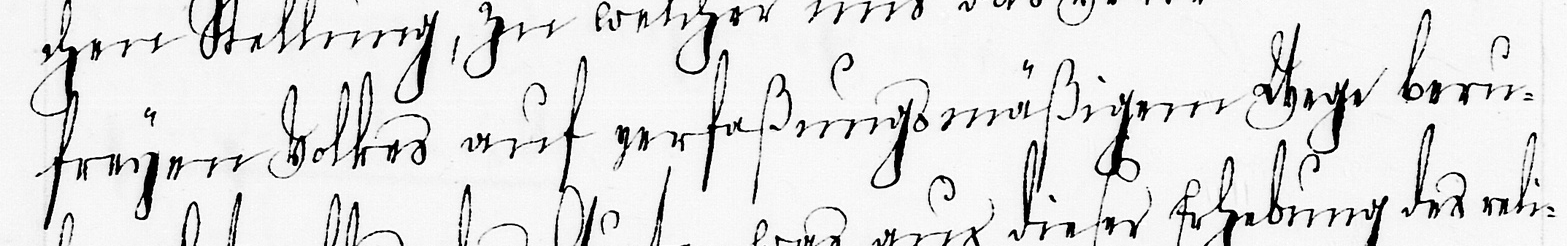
freyen Volkes auf verfaßungsmäßigem Wege beru¬
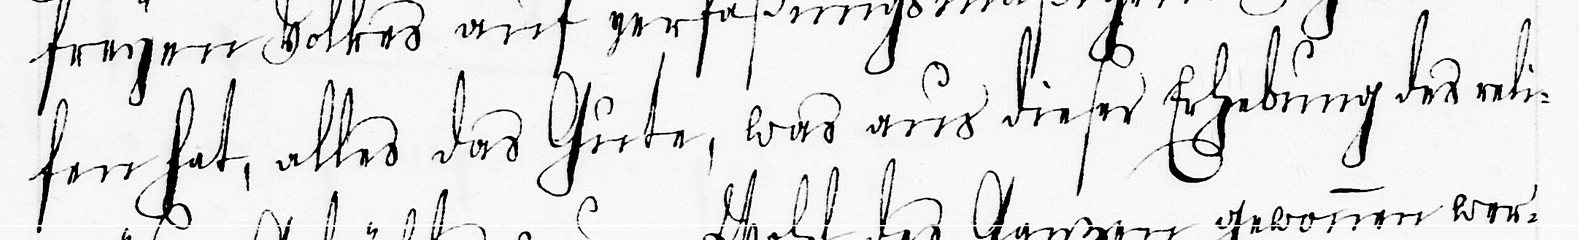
fen hat, alles das Gute, was aus dieser Erhebung des reli¬
